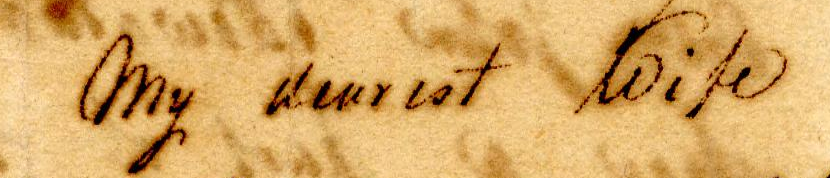My dearest Wife
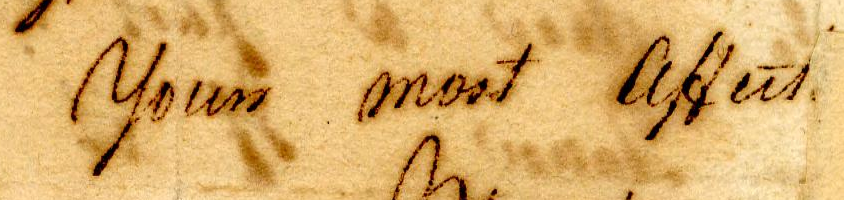Yours most Affect
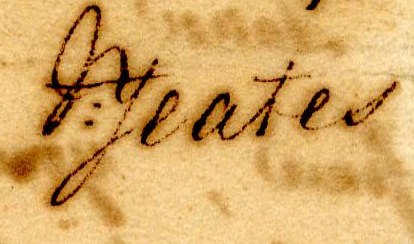J. Yeates
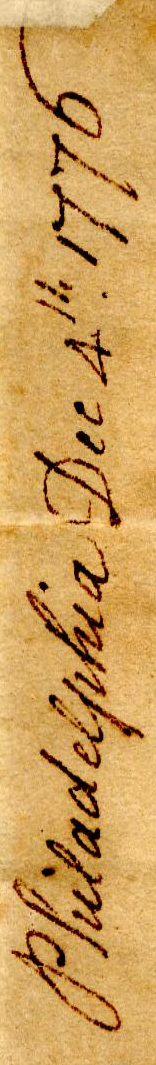Philadelphia Dec 4^th. 1776
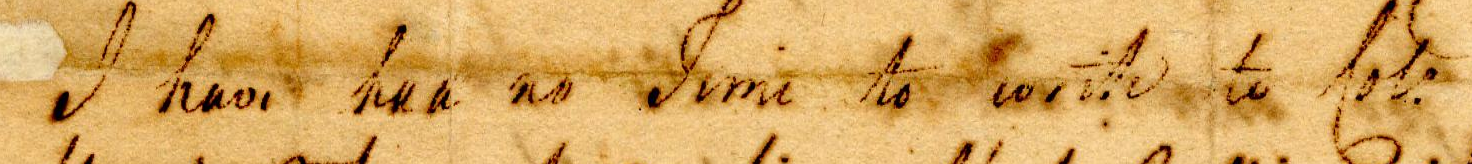I have had no Time to write to Col:
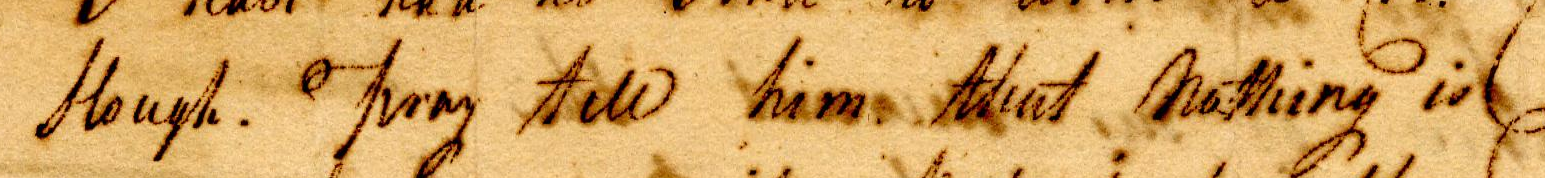Hough. Pray tell him that nothing is
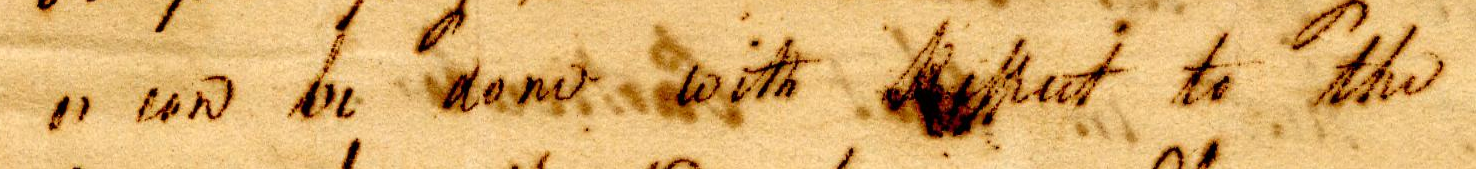as can be done with Respect to the
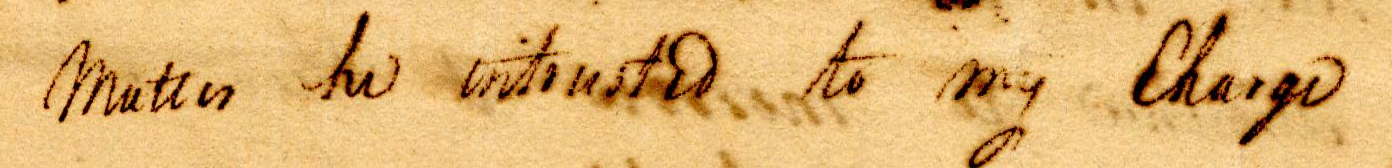Matter he intrusted to my Charge
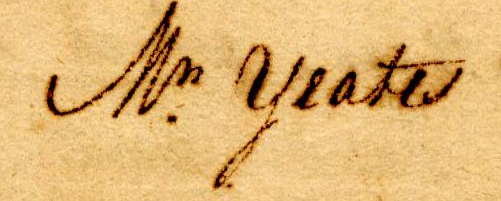M^r. Yeates
